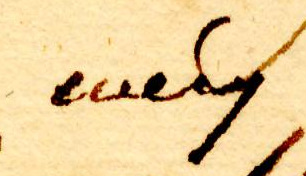every
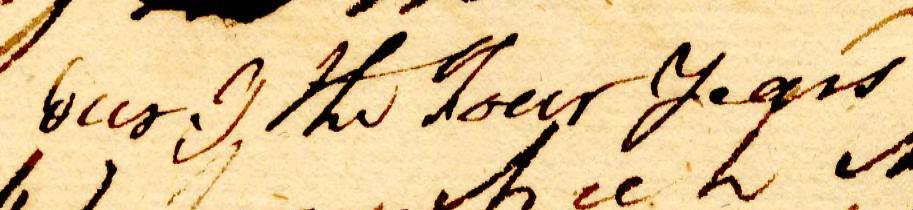bus^g. the four years
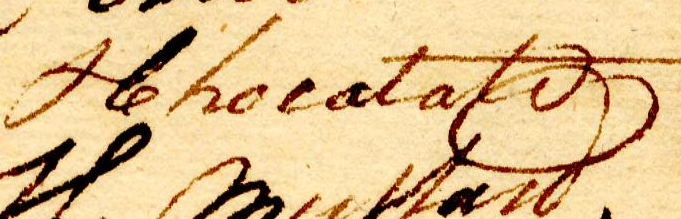& chocolate
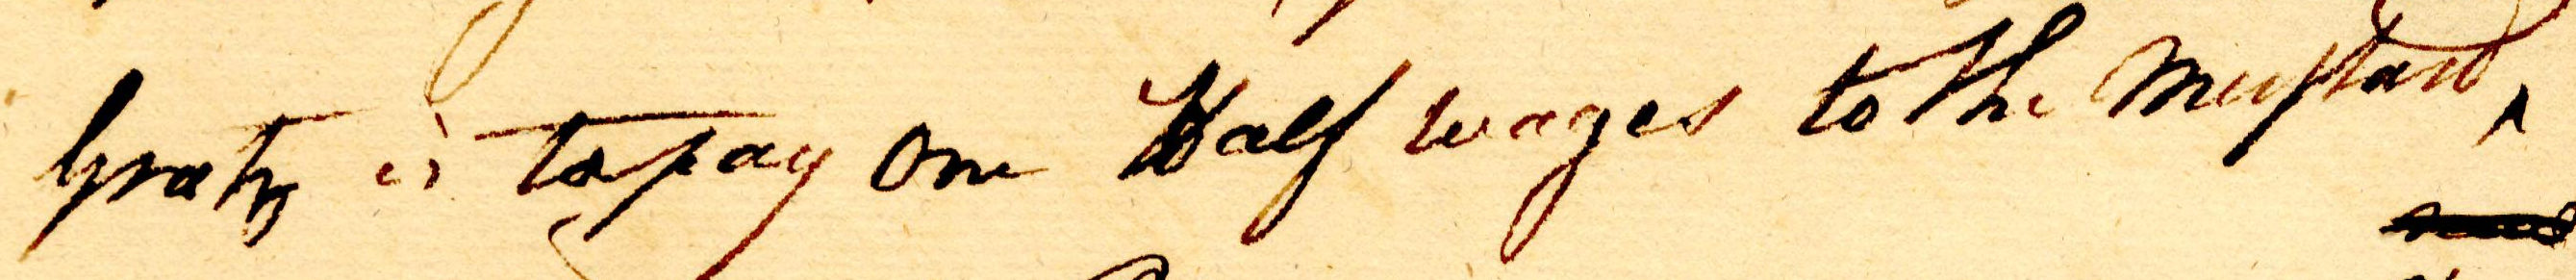Gratz is to pay one half wages to the Mustard ^
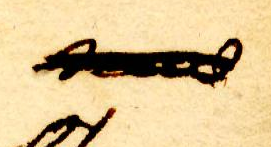[_]
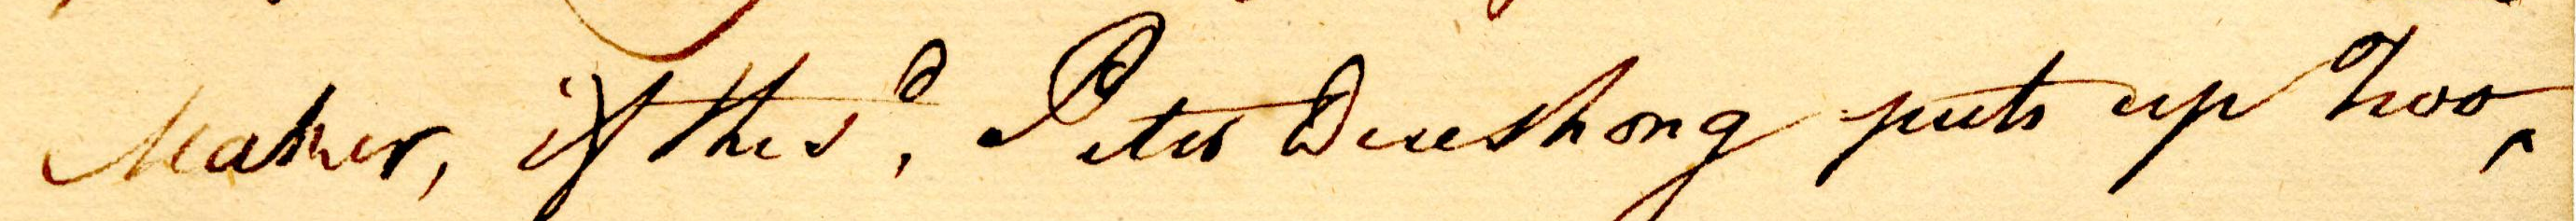Maker, if the s^d. Peter Dueshong puts up Two
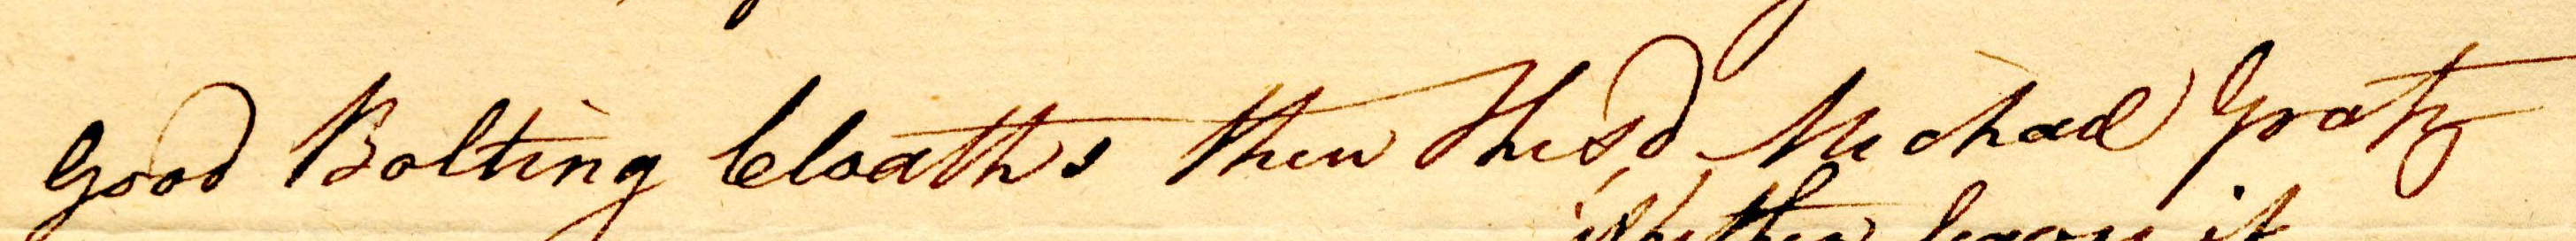Good Bolting Cloaths then the s'd Michaed Gratz
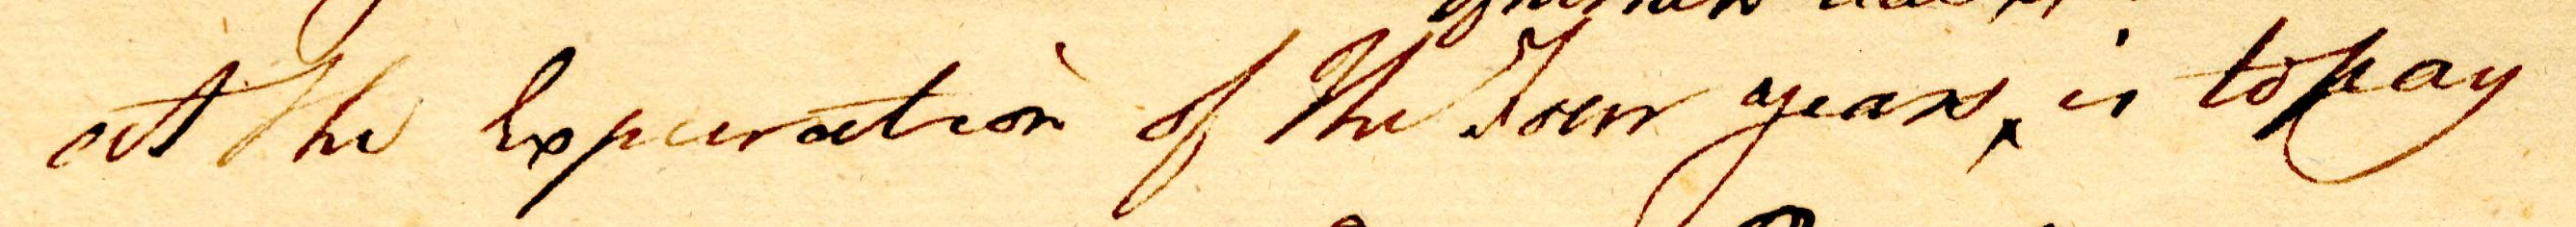at the Expiration of the four year is to pay
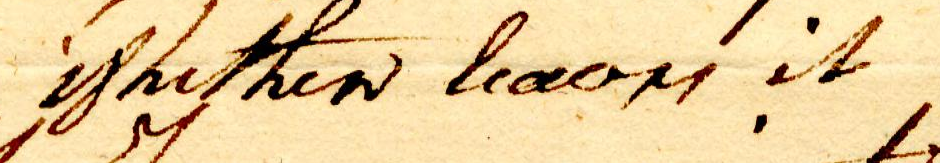if he then leaves it
